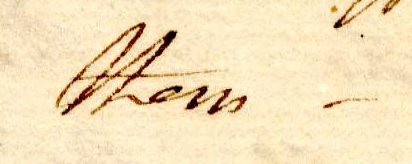them
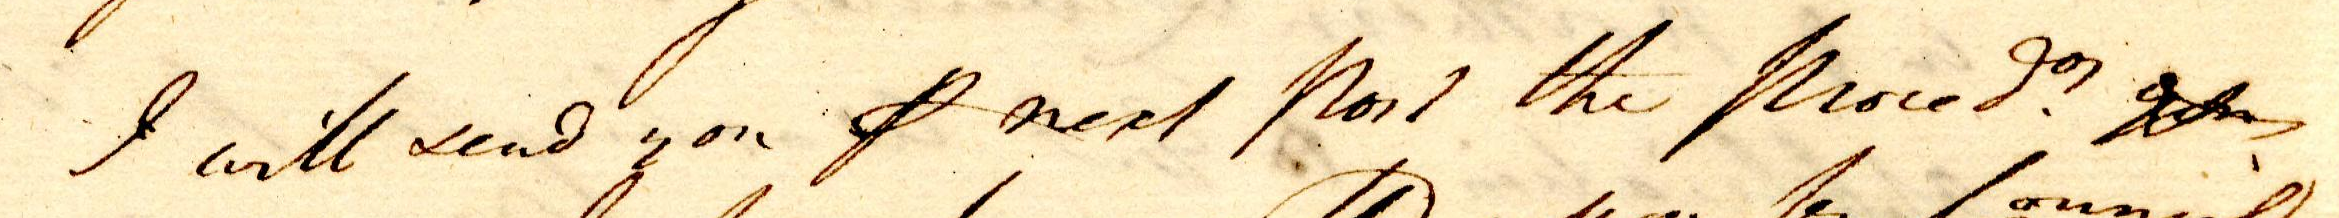I will send you per next post the proced^s.
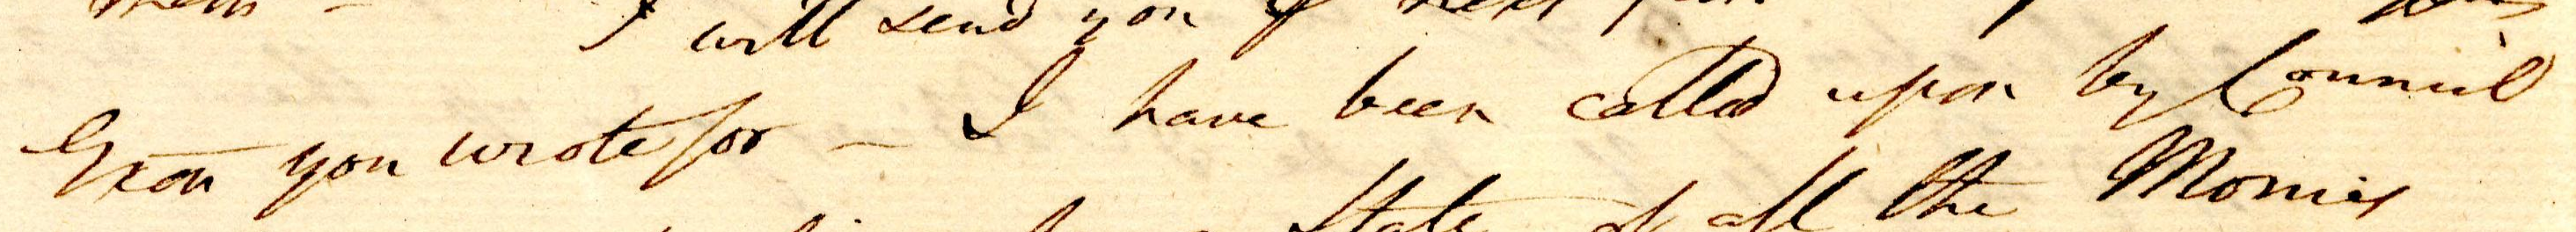now you wrote for. I have been called upon by Council
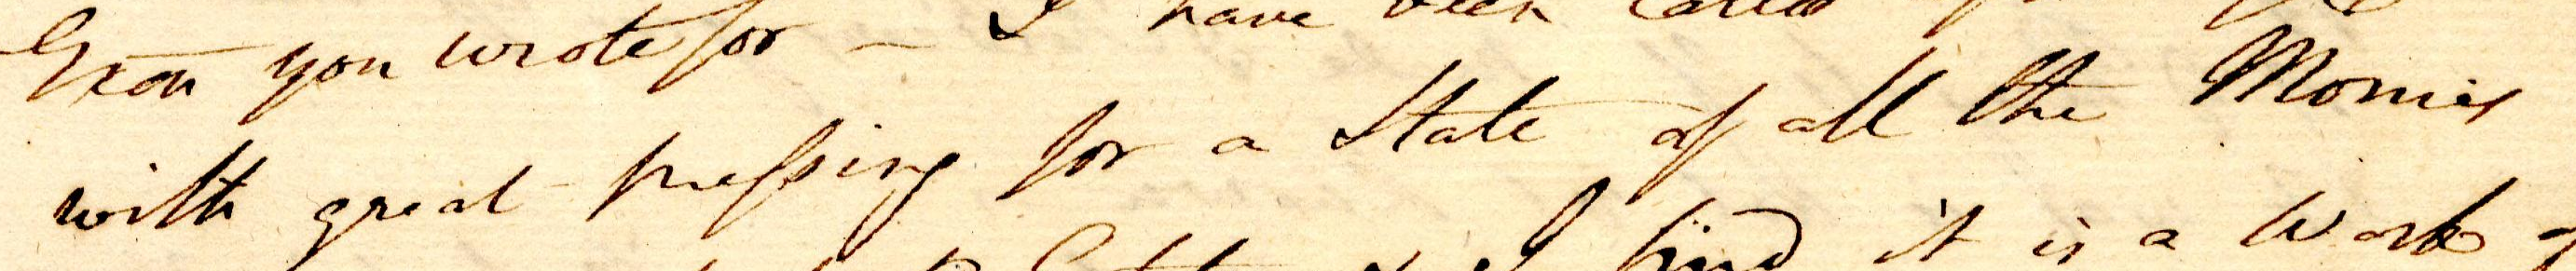with great pressing for a State of all the Monies
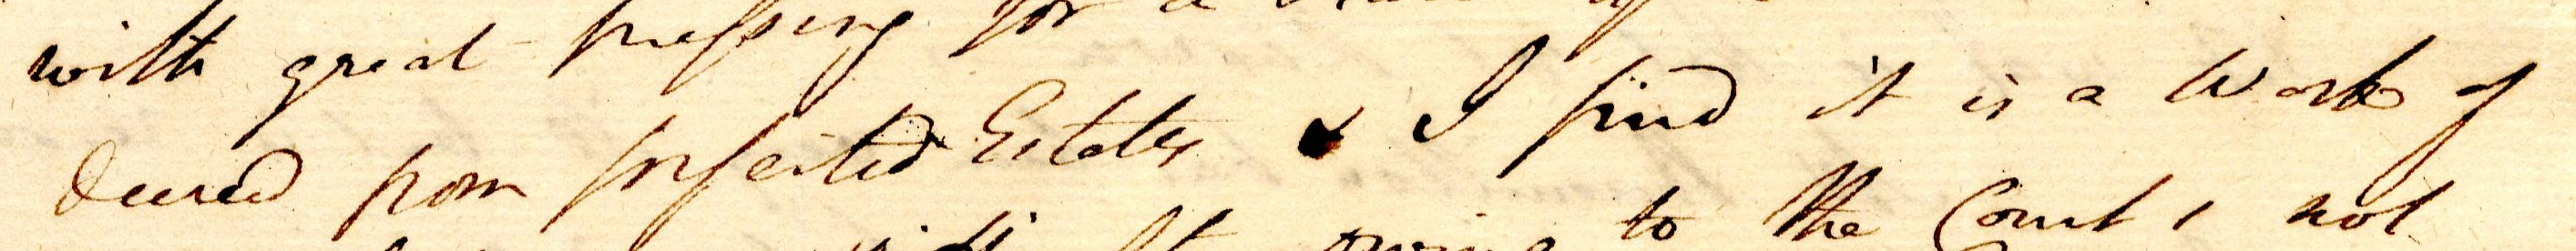desired from forfeited Estates & I find it is a work of
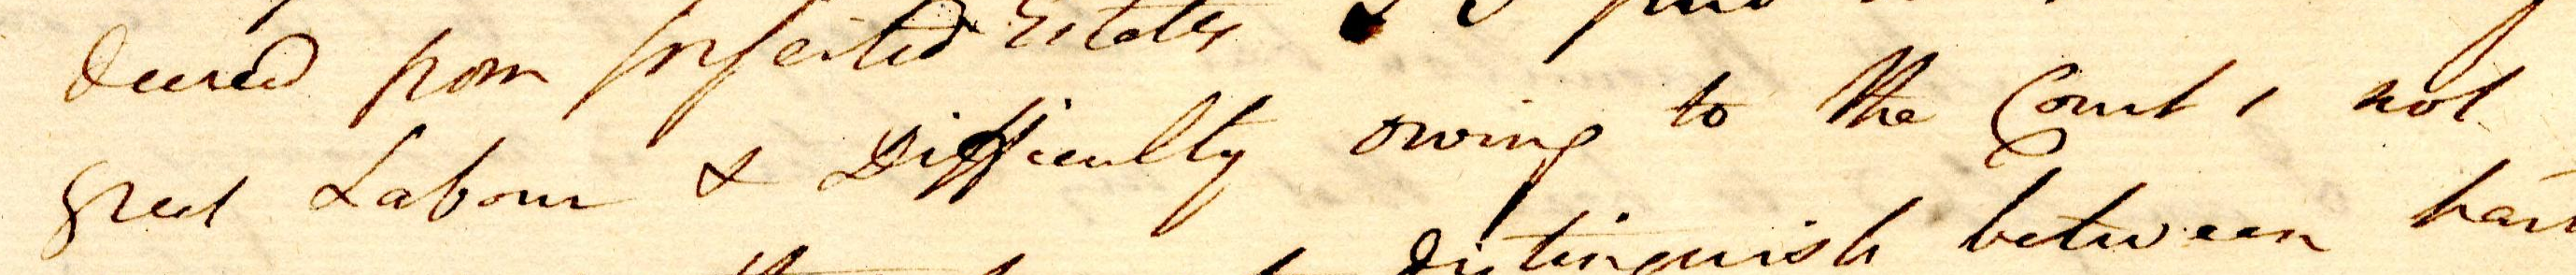great Labour & Difficulty owing to the Courts not
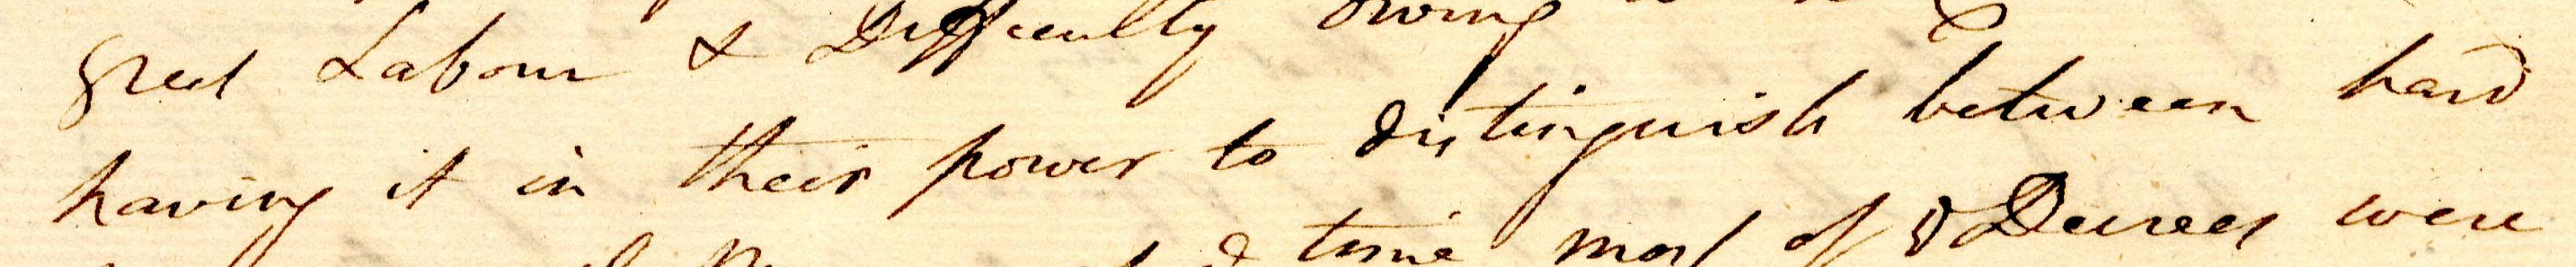having it in their power to distinguish between hard
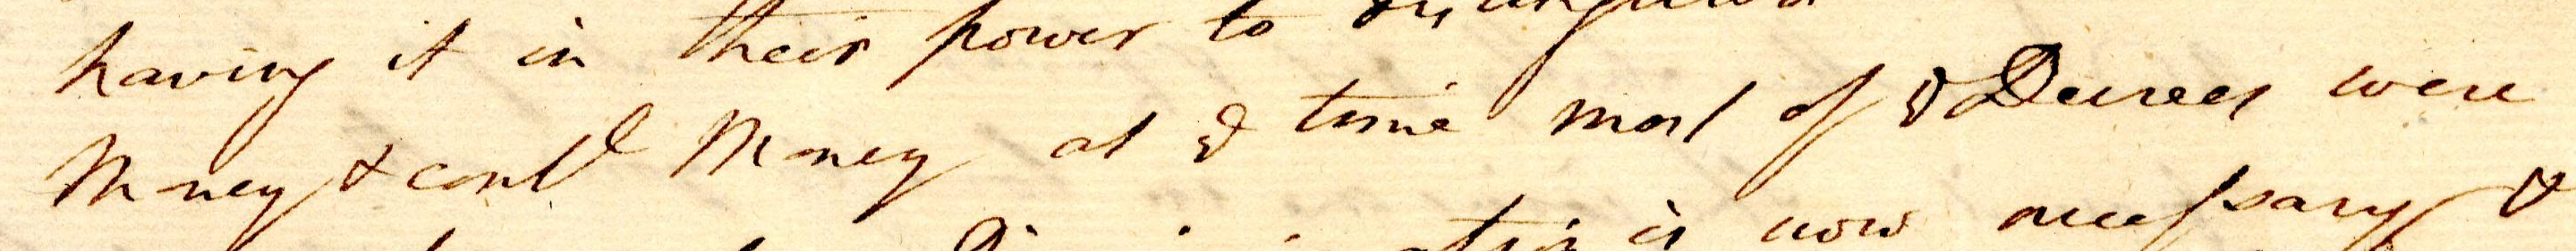Money & cont^l Money at y^e time most of y^e Decrees were
